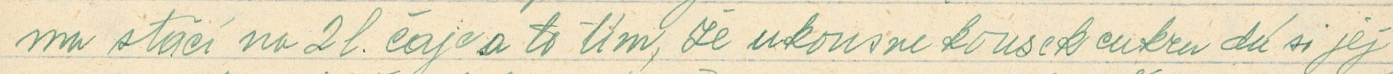mu stačí na 2l. čaje a to tím, že ukousne kousek cukru dá si jej
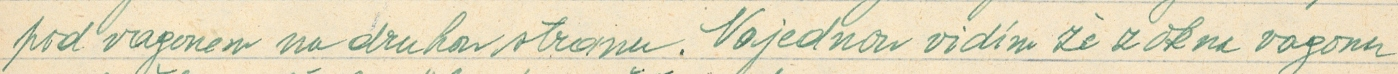pod vagonem na druhou stranu. Najednou vidím že z okna vagonu
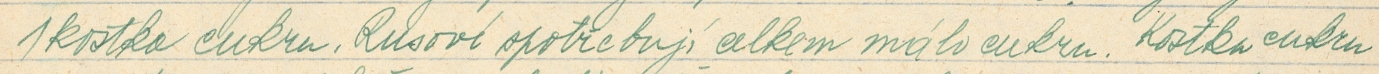1 kostka cukru. Rusové spotřebují celkem málo cukru. Kostka cukru
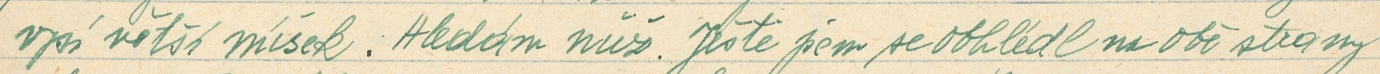vysí větší míšek. Hledám nůž. Ještě jsem se obhlédl na obě strany
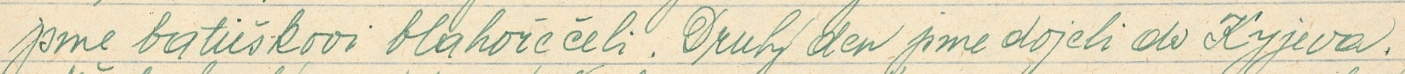jsme batuškovi blahořečeli. Druhý den jsme dojeli do Kyjeva.
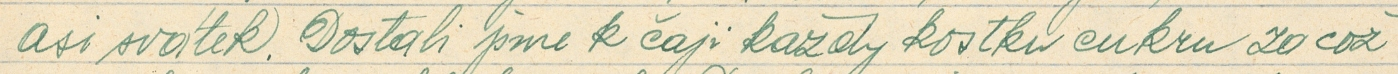asi svátek. Dostali jsme k čaji každý kostku cukru za což
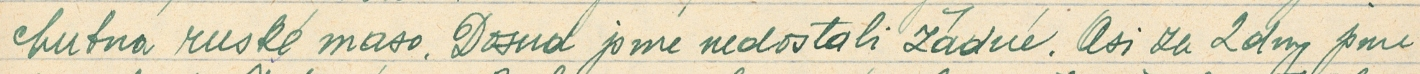chutná ruské maso. Dosud jsme nedostali žádné. Asi za 2 dny jsme
